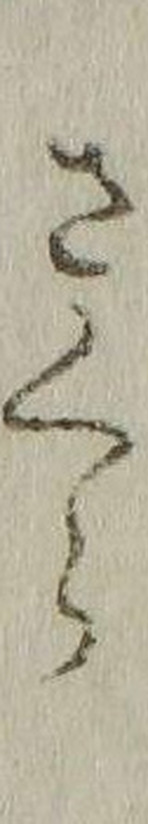さくら
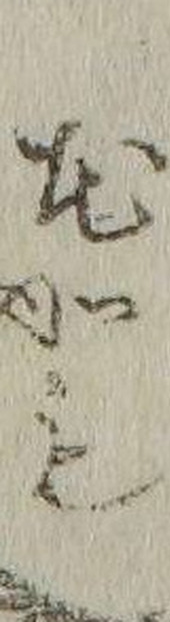花かも
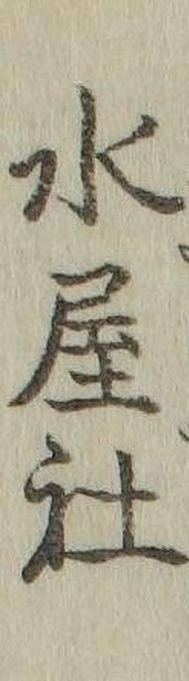水屋社

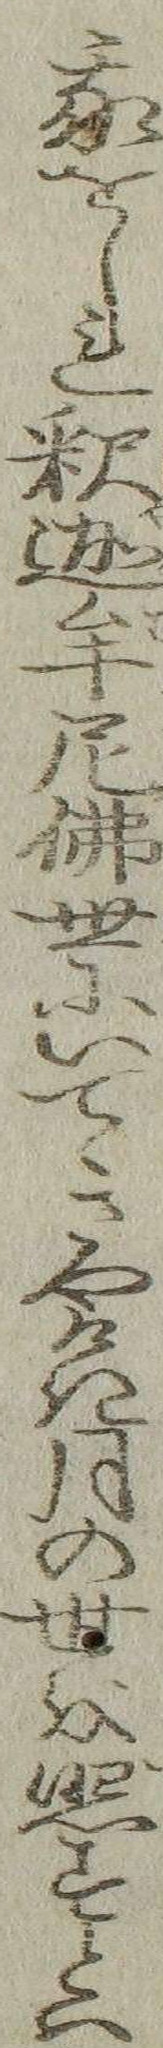我をしれ釈迦牟尼佛世にいてゝさやけき月の世を照すとは
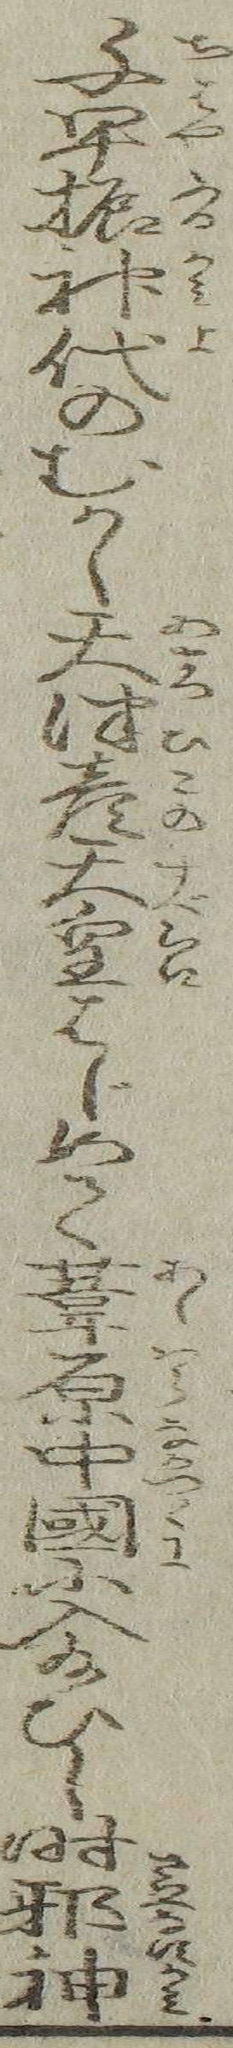千早振神代のむかし天津彦天皇はじめて葦原中國に入給ひし时邪神
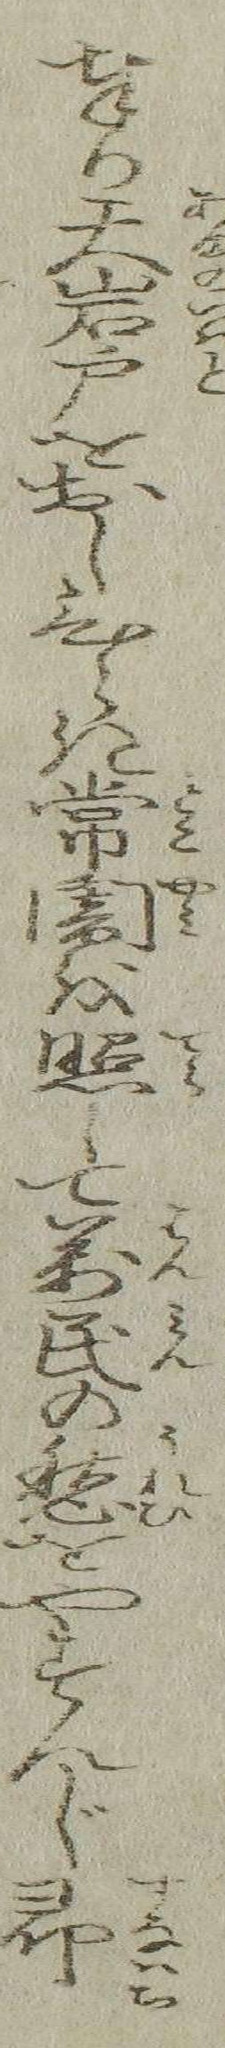奉り天岩戸をおしひらき常闇を照して萬民の愁をやすんじ即
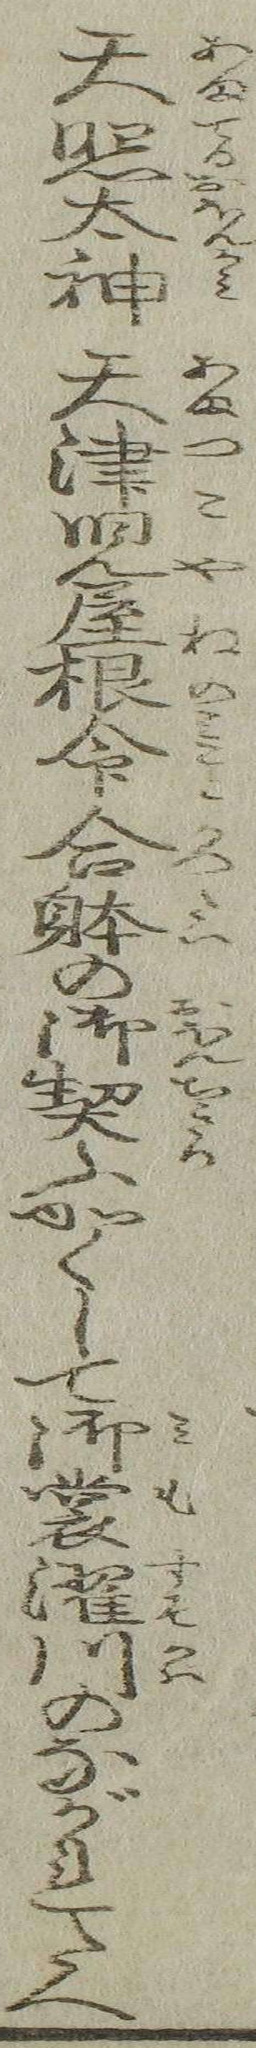天照太神天津児屋根命合躰の御契ふかくして御裳濯川のながれたへ
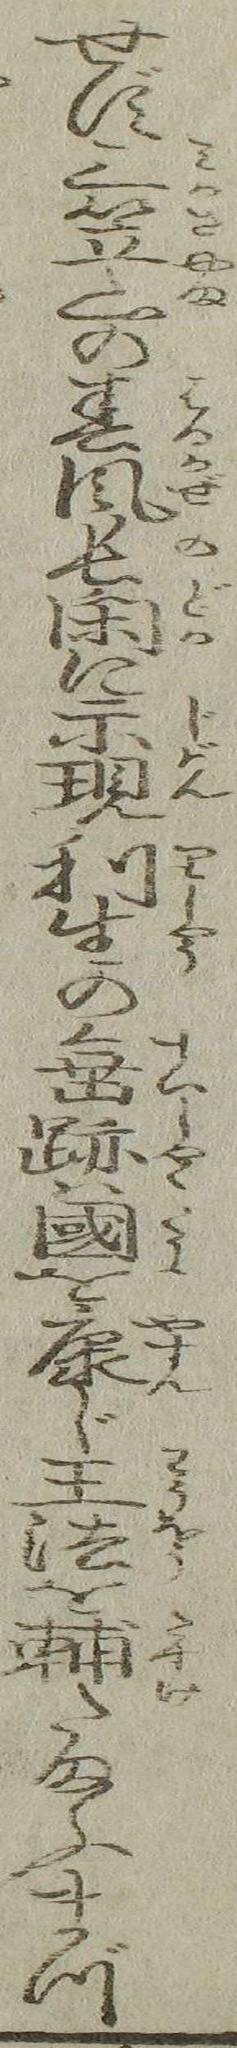せず三笠山の春風長閑に示現利生の垂跡は國を康じ王法を輔たまふまづ
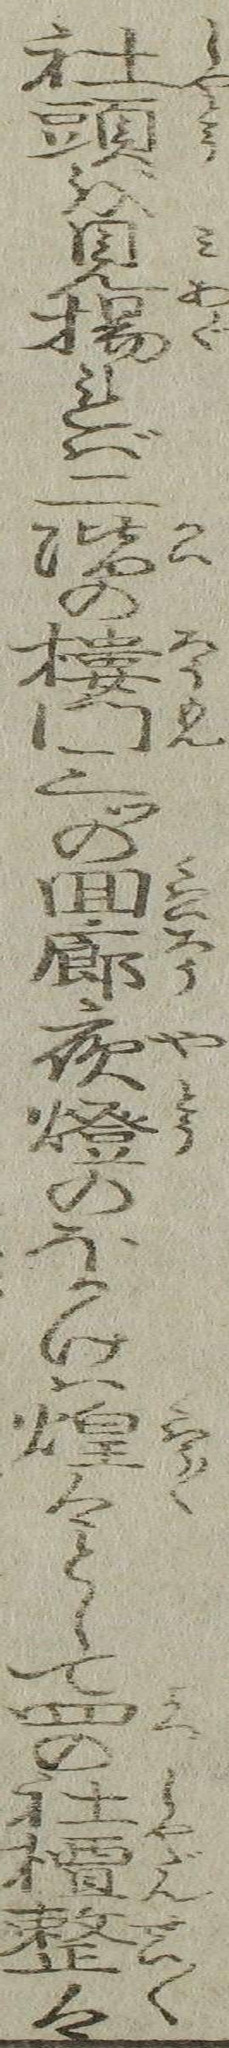社頭を見揚れば二階の樓門三ッの囬廊夜燈のほかけは煌々として四の社檀整々
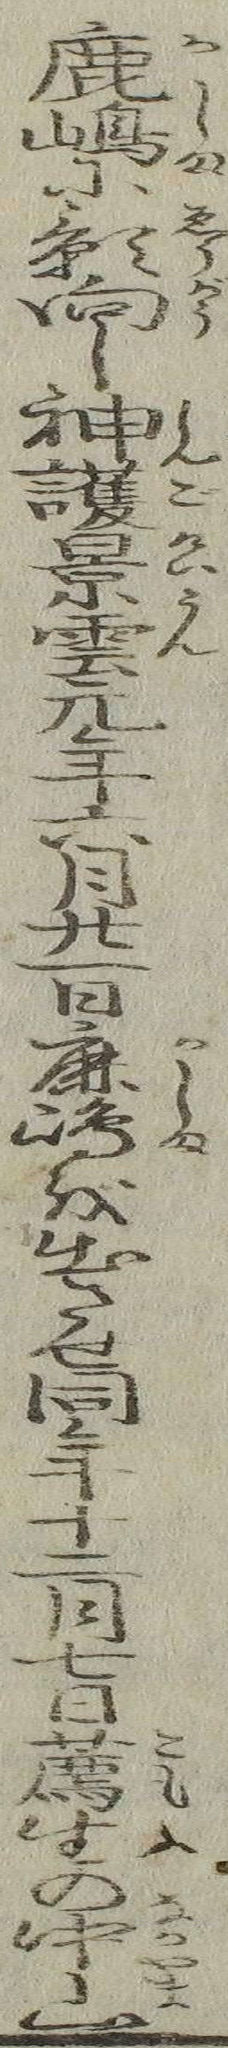鹿嶋に影向し神護景雲元年六月廿一日鹿嶋を出させ同年十二月七日薦生の中山
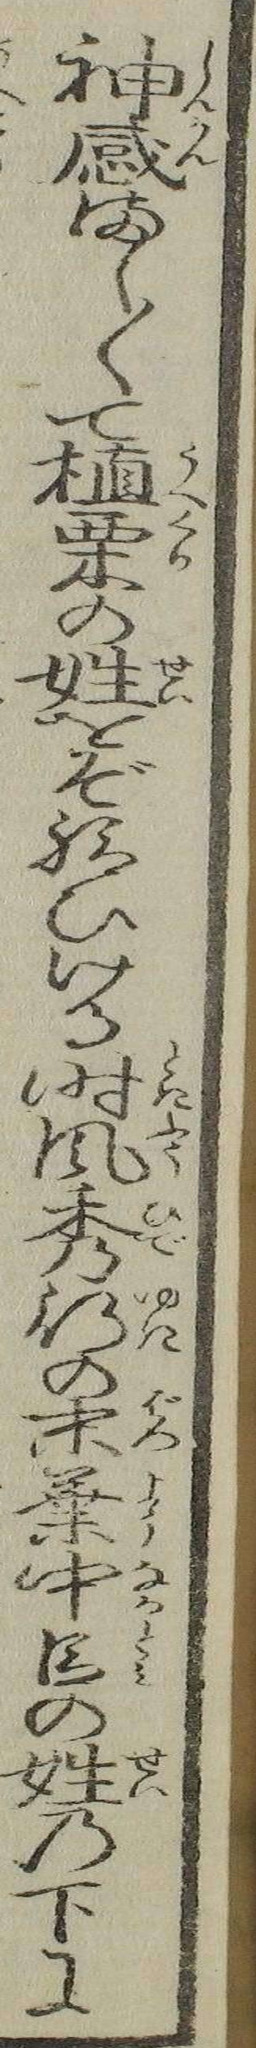神感まし〳〵て植栗の姓をぞ給ひける时風秀行の末葉中臣の姓の下に
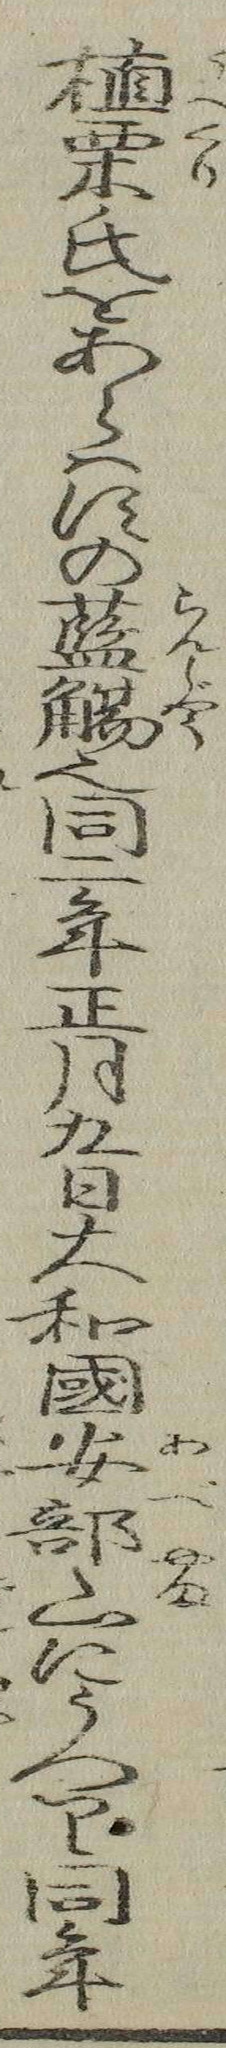植栗氏をあらはすの藍觴也同二年正月九日大和國安部山にうつり同年
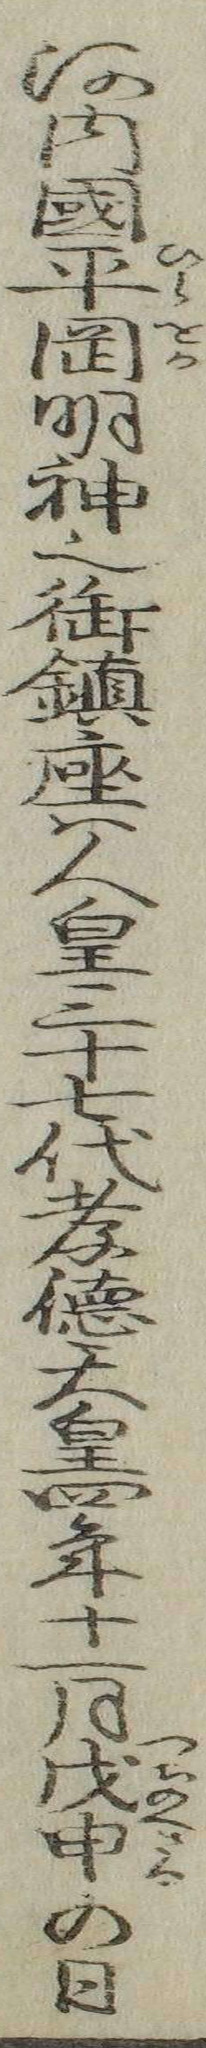河内國平岡明神也御鎭𫝶は人皇三十七代孝德天皇四年十一月戊申の日

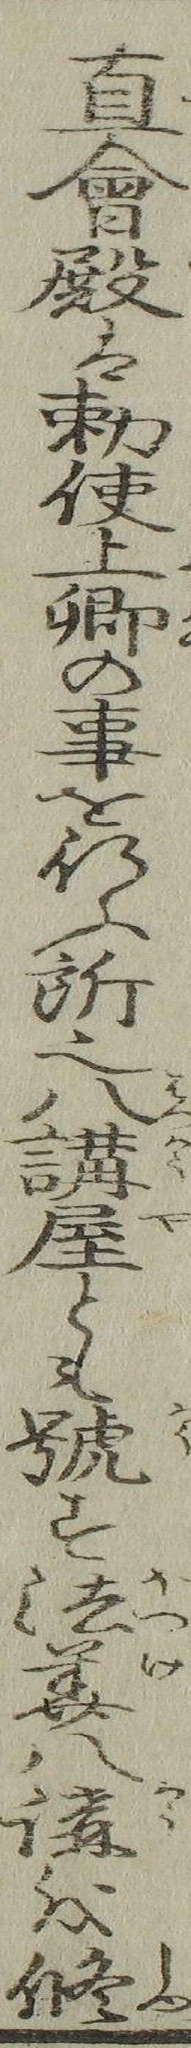直會殿は勅使上卿の事を行ふ所也八講屋とも號す法華八講を修
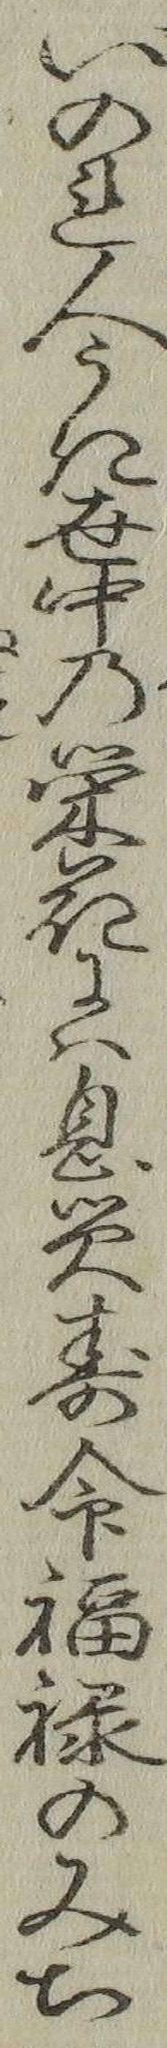いのれ人うき世中の栄花には息災寿命福禄のみち
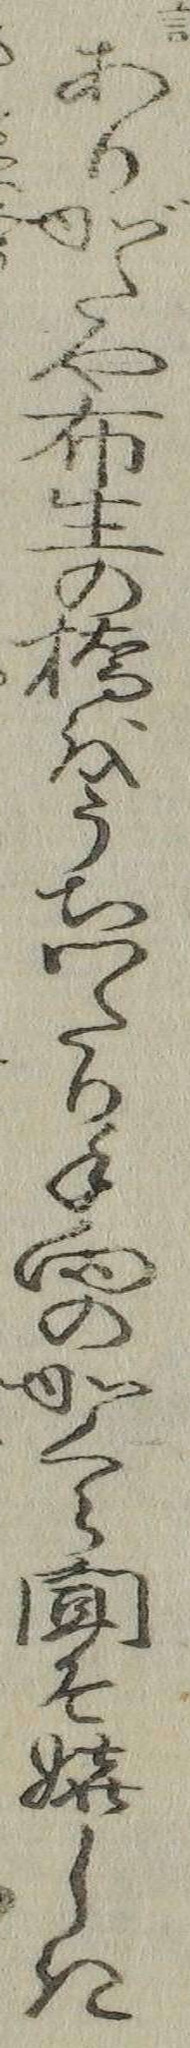ありがたや布生の槗をうちわたり手向のかくら聞そ嬉しき
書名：大和名所圖會
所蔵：国文学研究資料館
